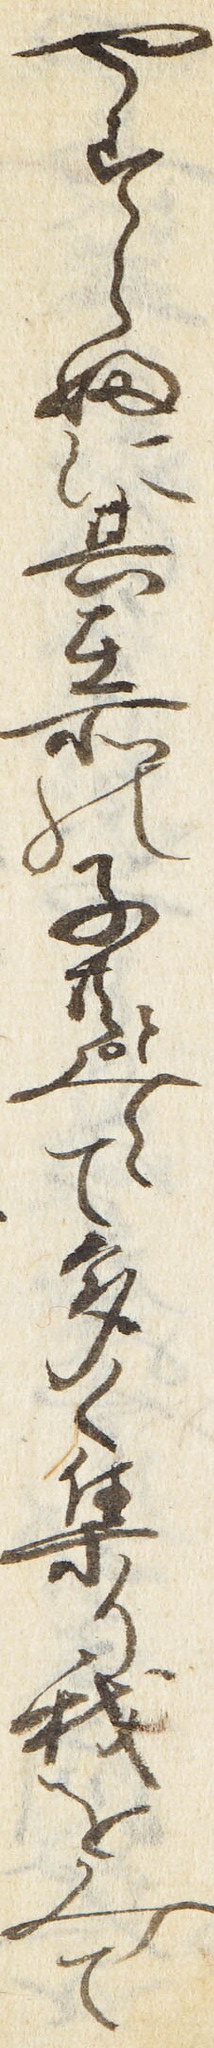やすらふに其在所の子共とみえて多く集り我をみて
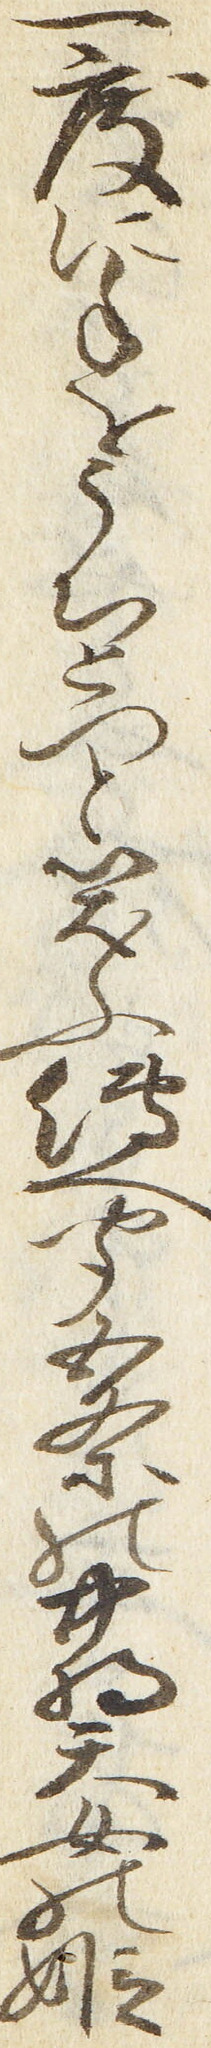一度に手をうちとつと笑ふ伝へ聞五条の中将天女の姫
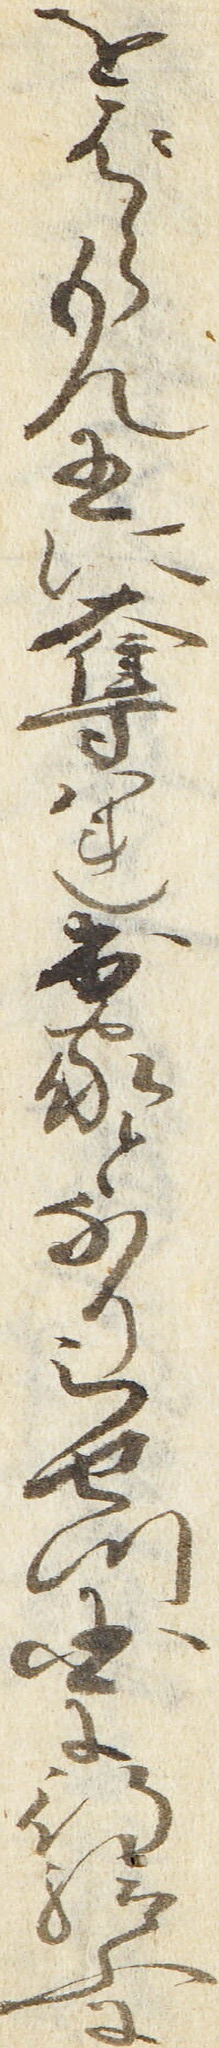をばらもん王に奪ハれ出家となりらせつ国に行給ふに

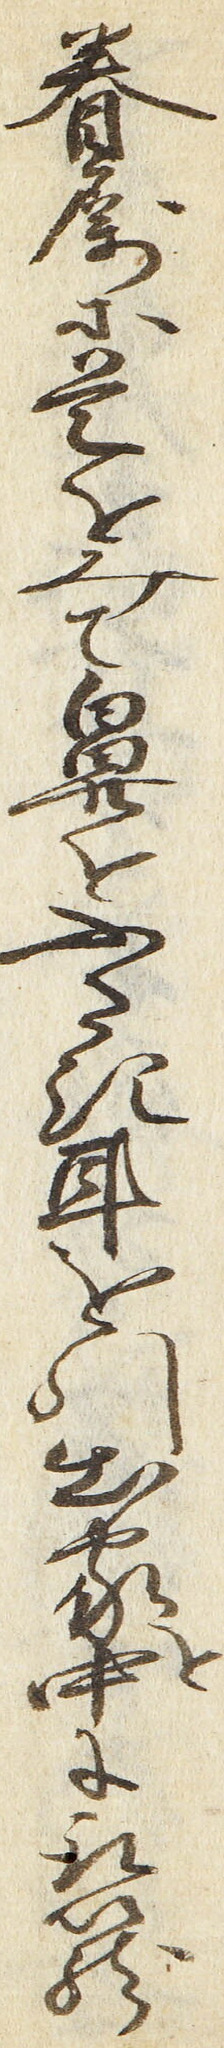眷属等是をみて鼻をふたき耳を引出家を中に取籠
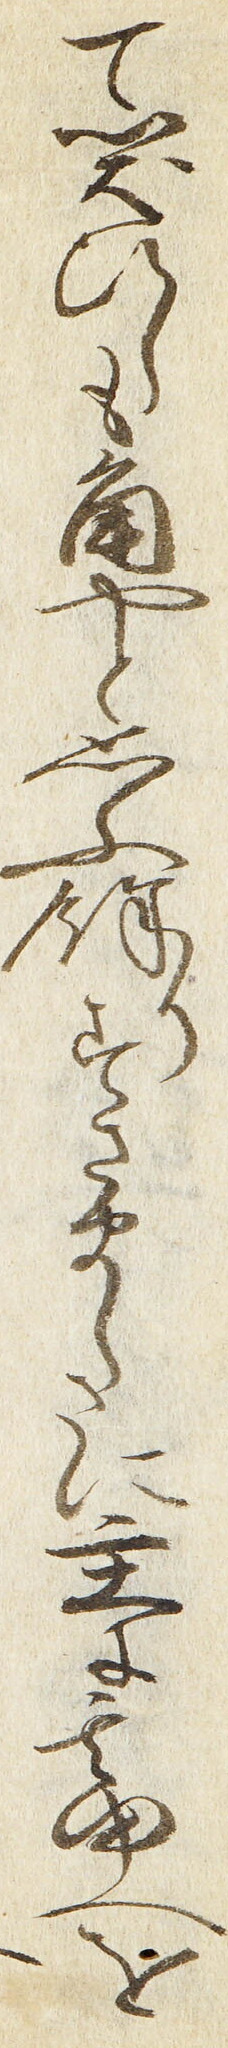て笑ひしも角やと思ふ余りすさましさに主に其ゆへを
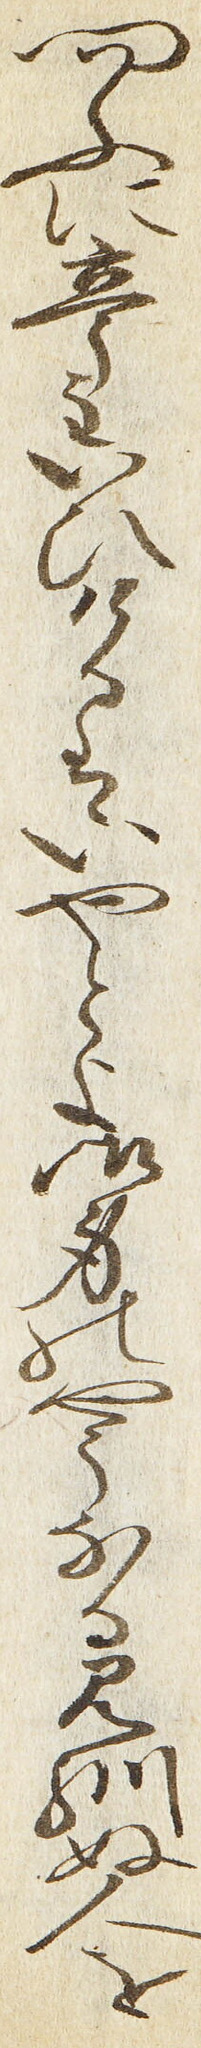問ふに亭主いひけるはいやとよ御身のやうなる見馴ぬ人を
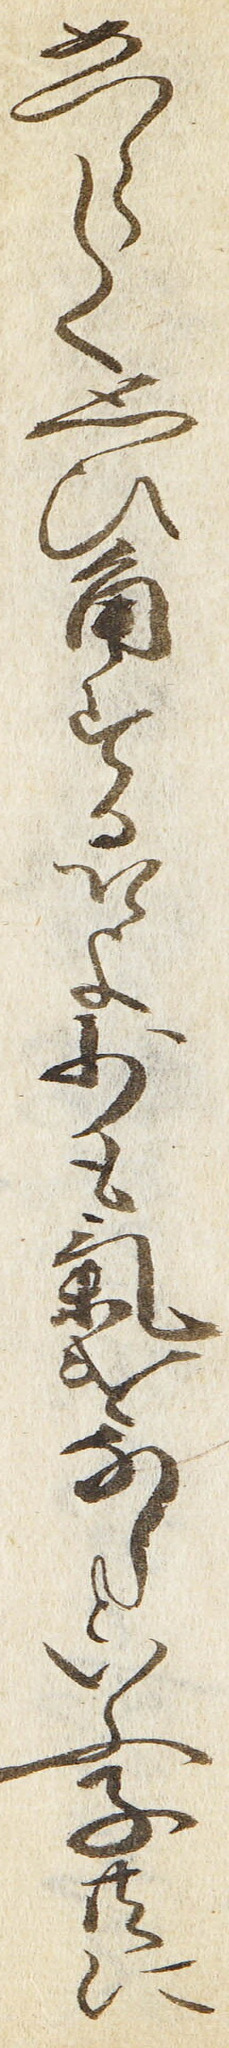めつらしく思ひ角するそよ少も気遣なしといふ子共に
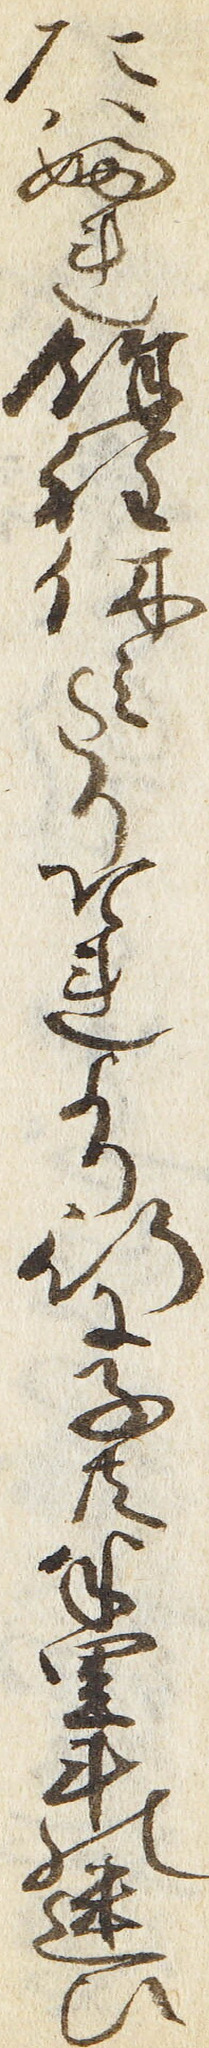たはふれ余程休みたりそれより行に子共半里計の迷ひ
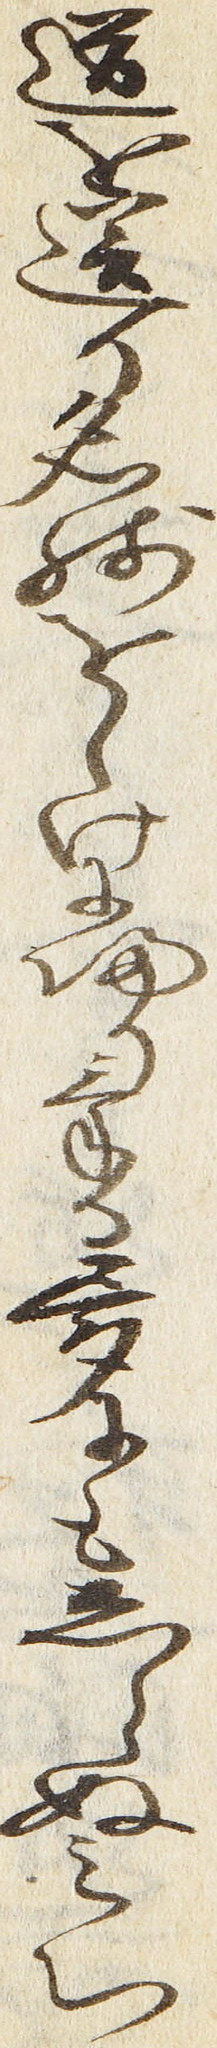道を送り名残をしけに帰りける夢にもしらぬみち
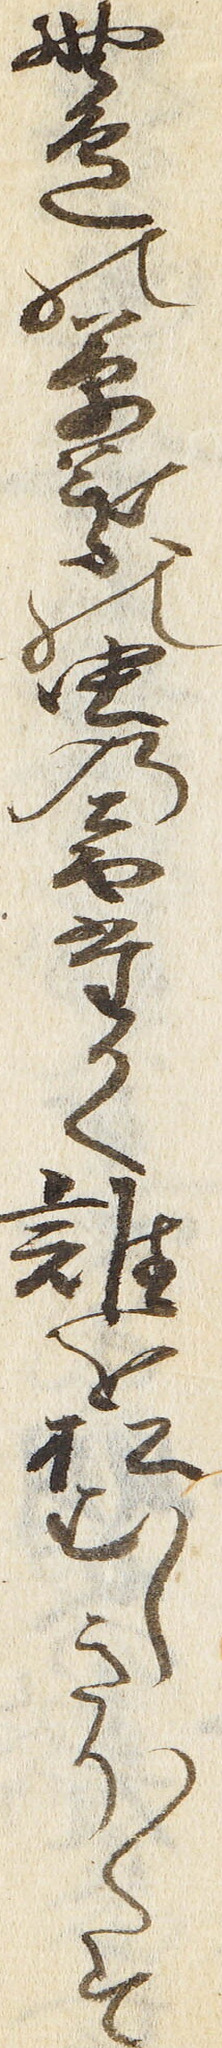此辺の草葉の虫の音たかく誰を松むしきり〳〵す
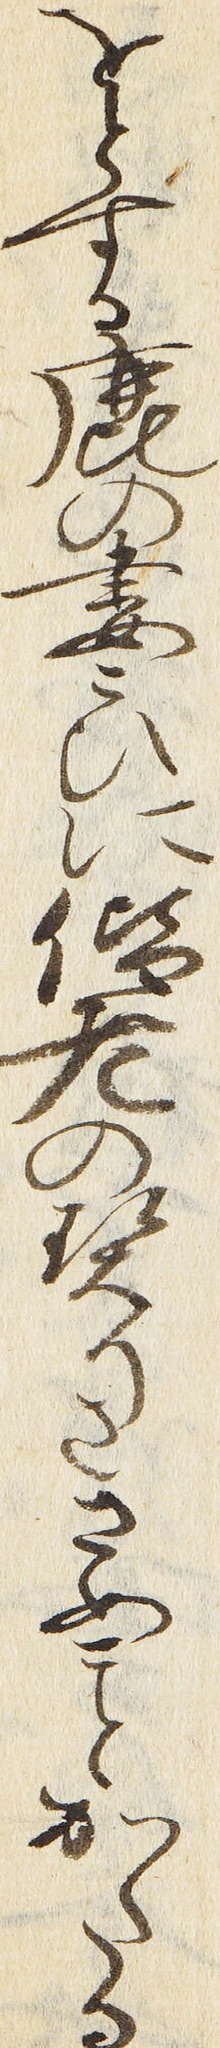をとする鹿の妻こひに偕老の契りささめことかたる
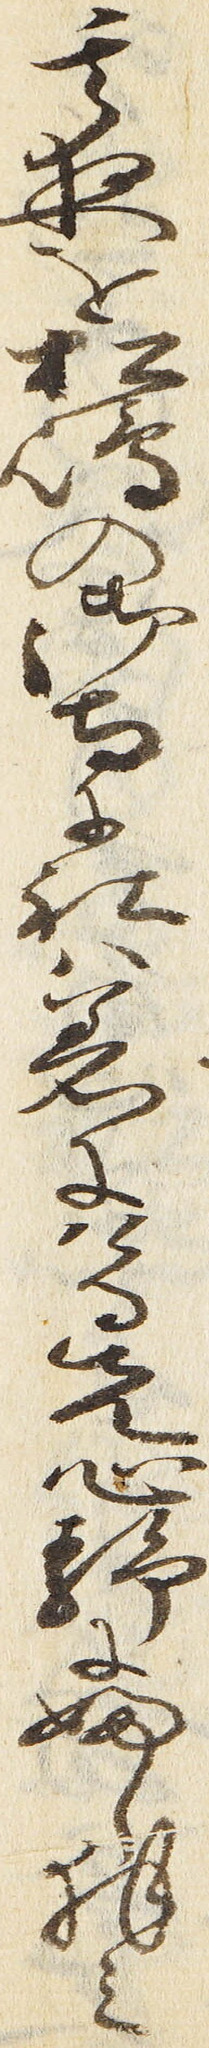其夜を松嶋の御寺に社ハ着にける先心静にふし拝み
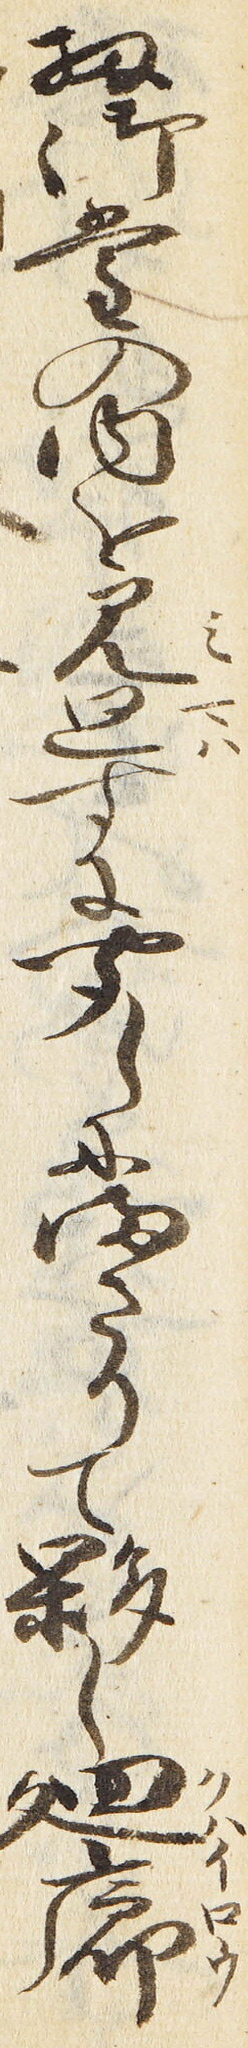扨御堂の内を見廻すに聞しにまさりて夥し廻廊
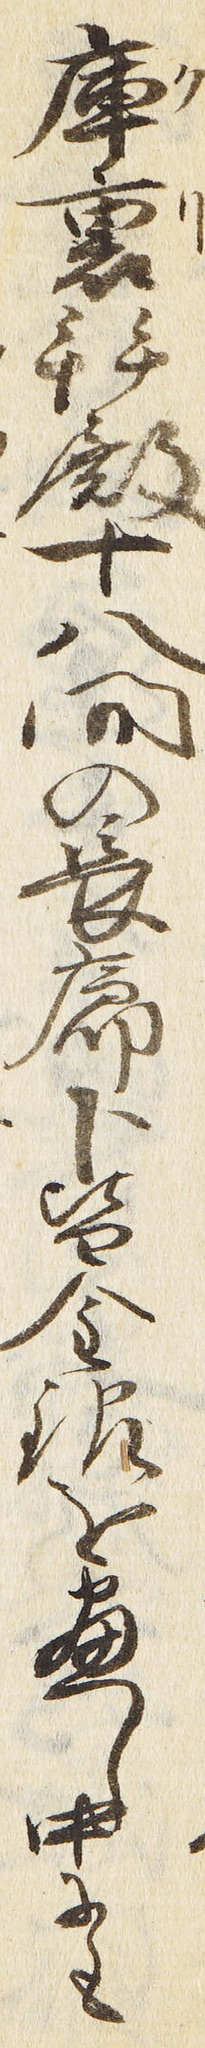庫裏拝殿十八間の長廊下皆金銀を尽し中にも
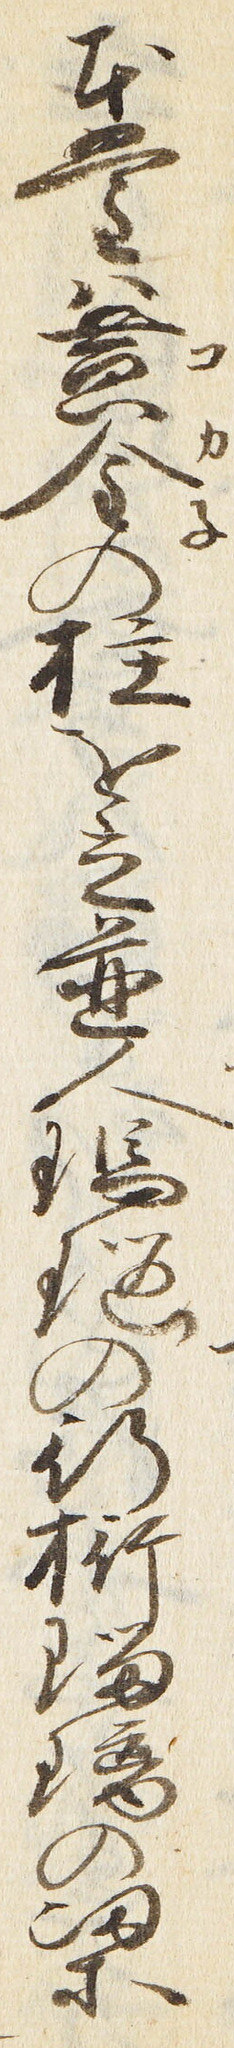本堂は黄金の柱を立並人瑪瑙の行桁瑠璃の梁
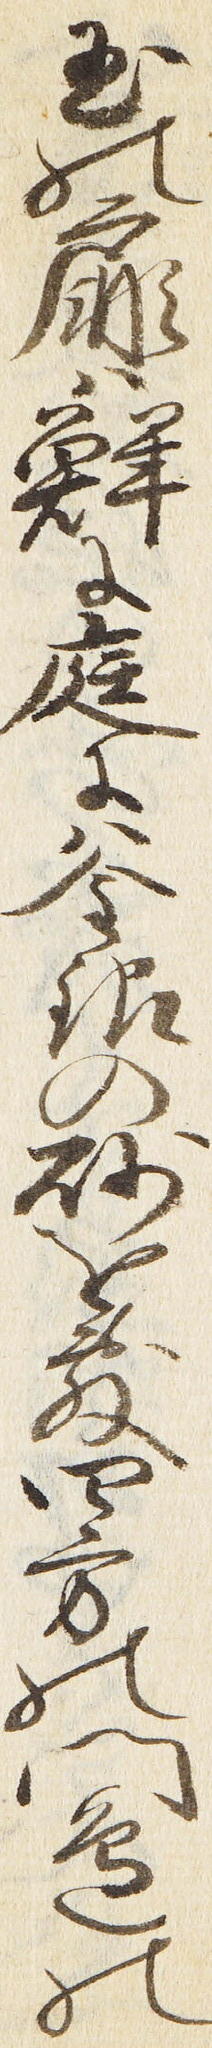玉の扉は鮮に庭には金銀の砂を敷四方の門辺の
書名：海陸世話日記
